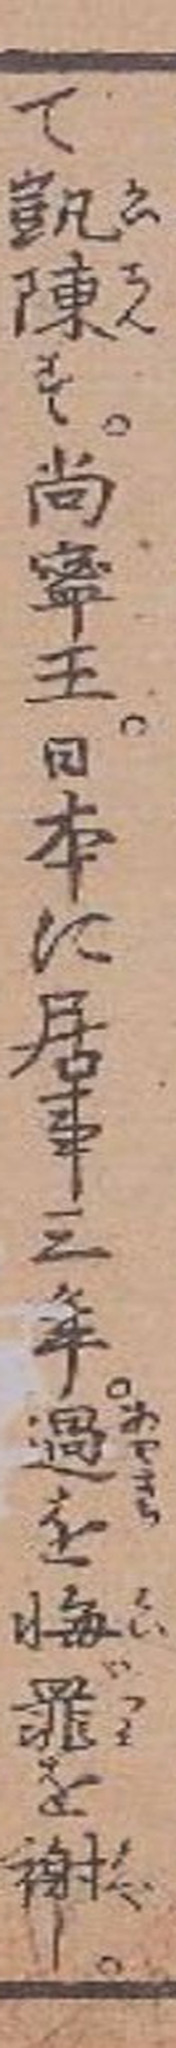て凱陣す。尚寧王。日本に居事三年。過を悔。罪を謝し。

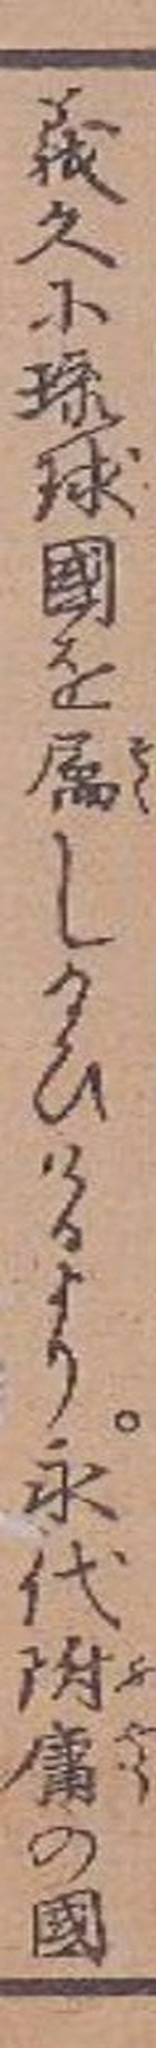義久に琉球国を属し給ひけるより。永代附傭の国
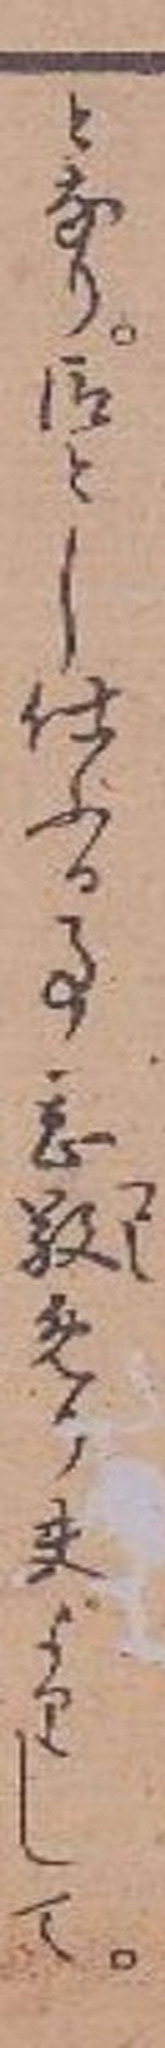となり。臣とし仕ふる事甚敬めり夫よりして。
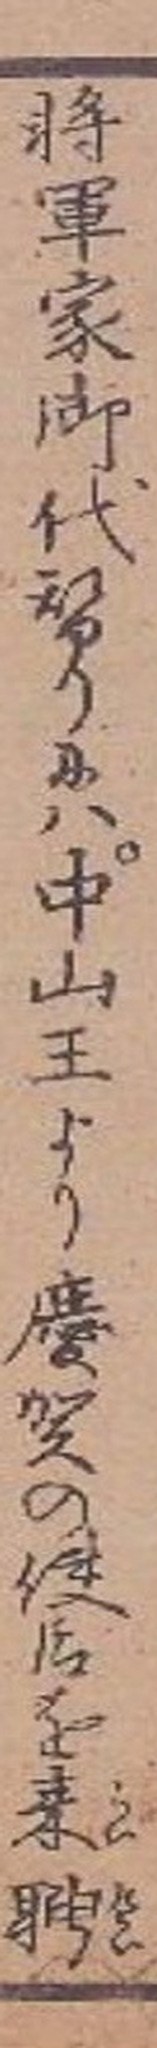将軍家御代替りには。中山王より慶賀の使臣を来聘
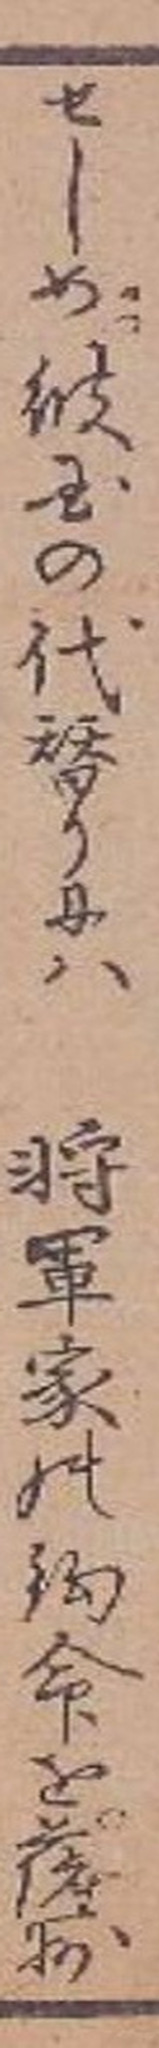せしめ。彼国の代替りには将軍家の鈎命を薩州
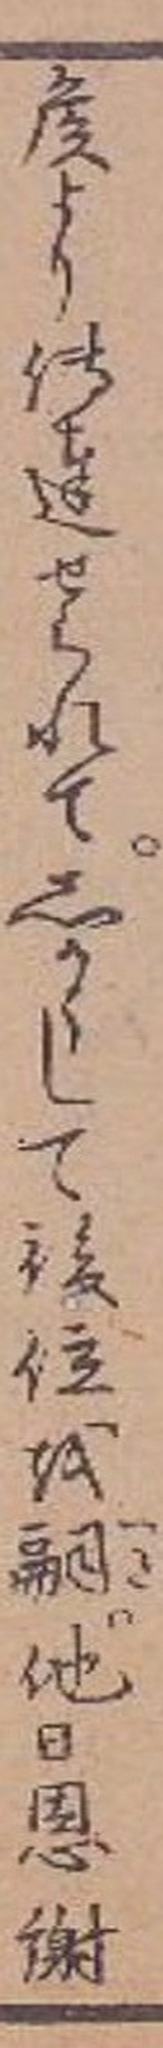候より伝達せられて。しかうして後位を嗣。他日恩謝
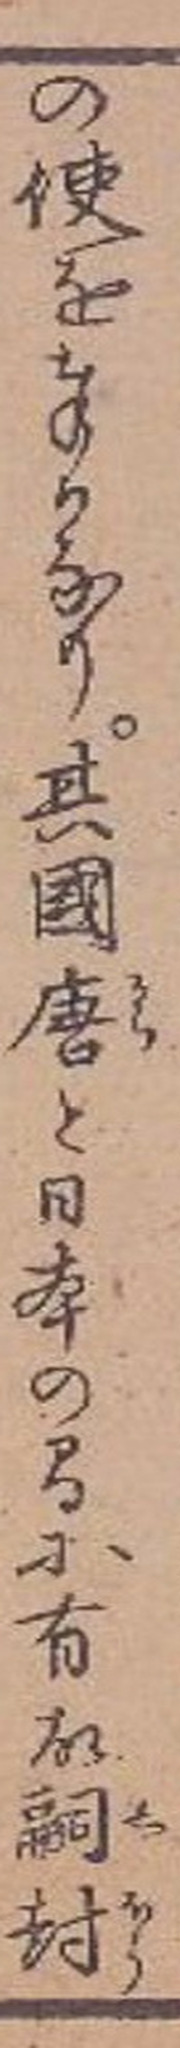の使を奉るなり。其国唐と日本の間に有故嗣封
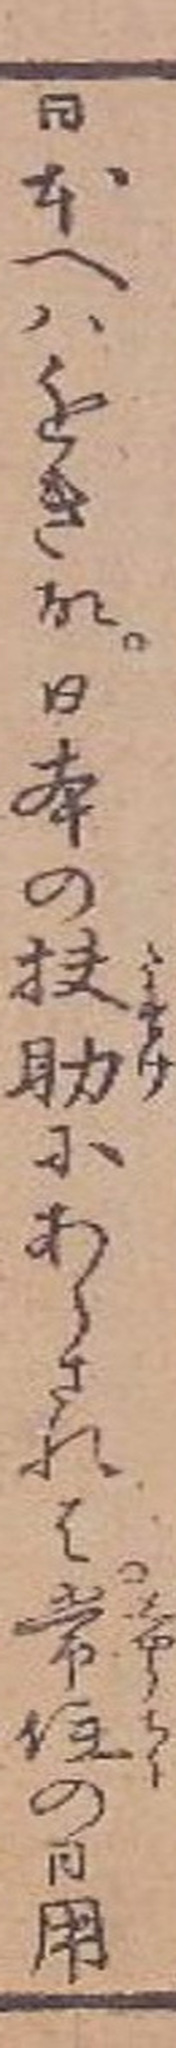日本へは近き故。日本の扶助にあらされは。常住の日用
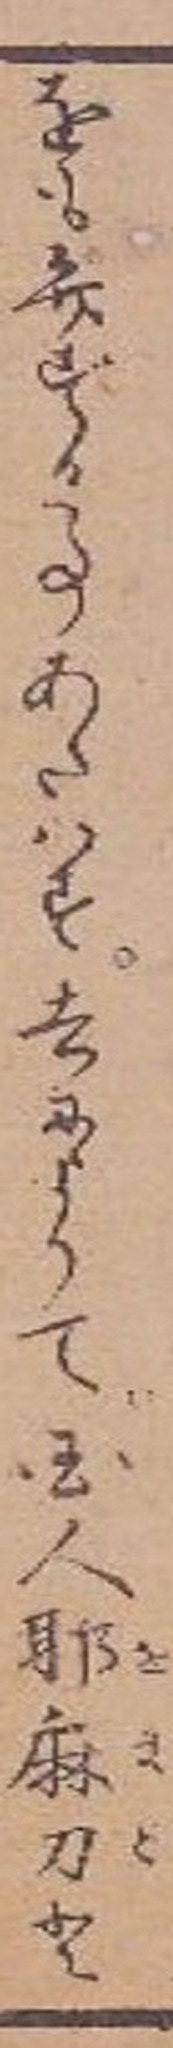をも弁ずる事あたはす。去によりて。国人耶摩刀と
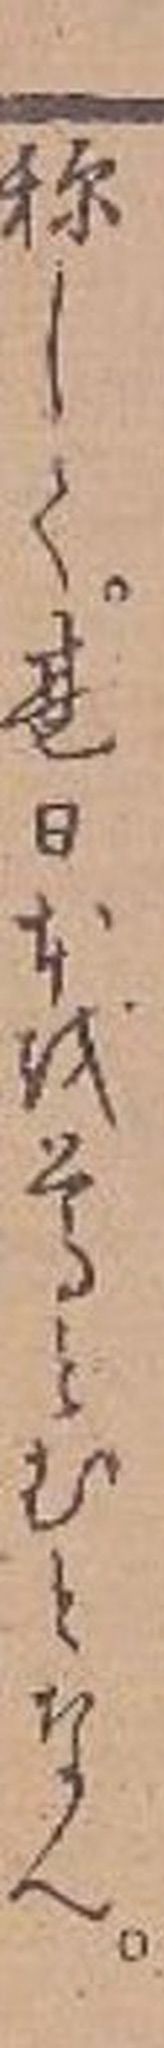称して。甚日本を尊とむとなん。
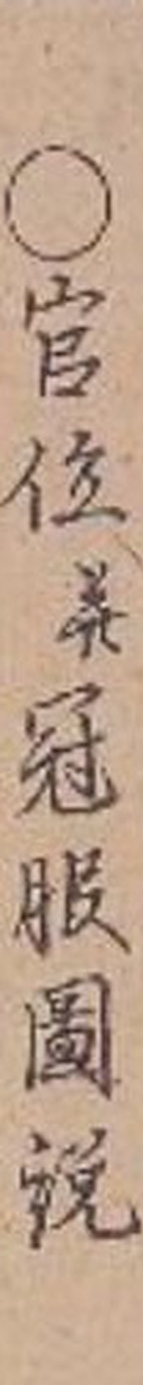〇官位幷冠服図説
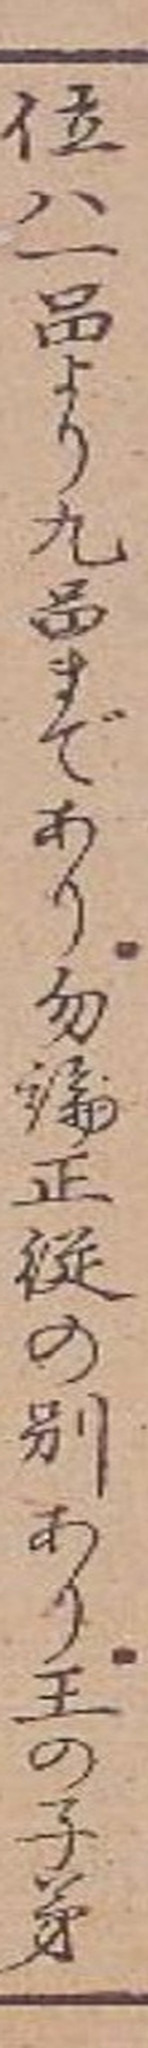位は一品より九品まであり•勿論正従の別あり•王の子弟
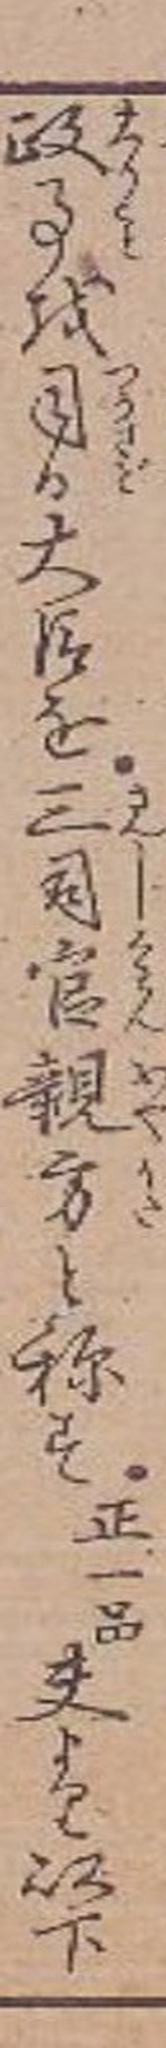政事を司る大臣を•三司官親方と称す•正一品夫より以下
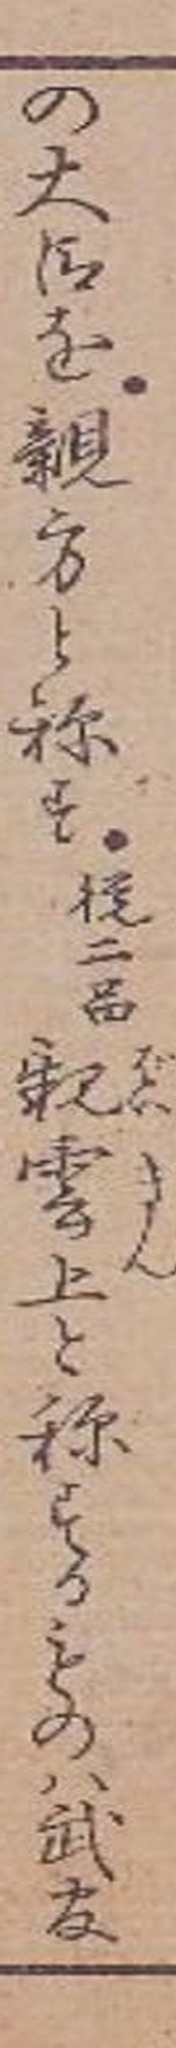の大臣を•親方と称す•従二品親雲上と称するものは武官
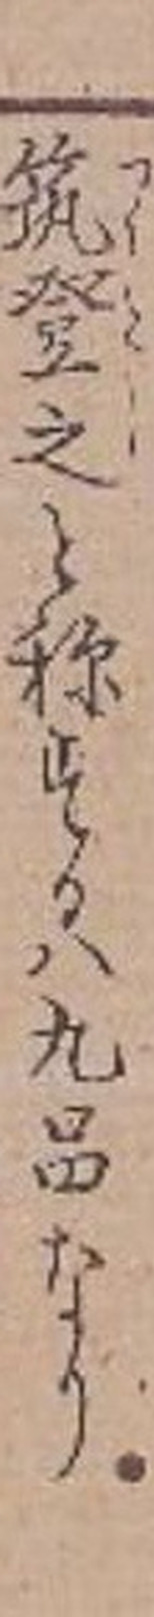筑登之と称するは九品なり•
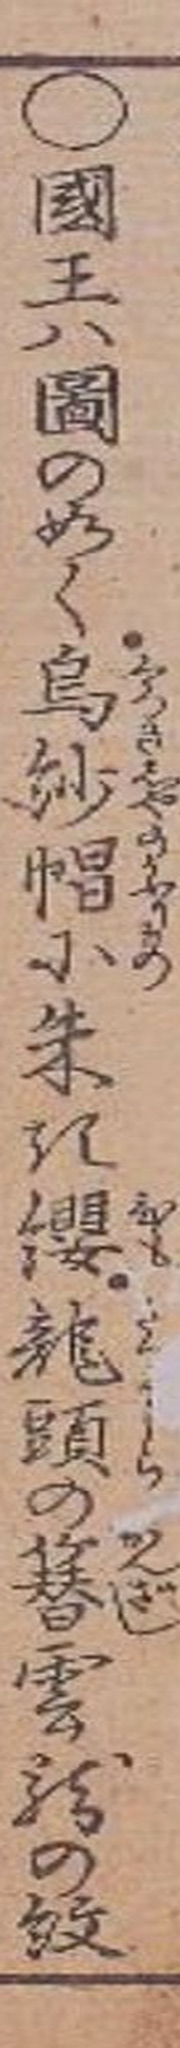〇国王は図の如く•烏紗帽に朱き纓•龍頭の簪雲龍の紋
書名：琉球談
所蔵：University of the Ryukyus Library
